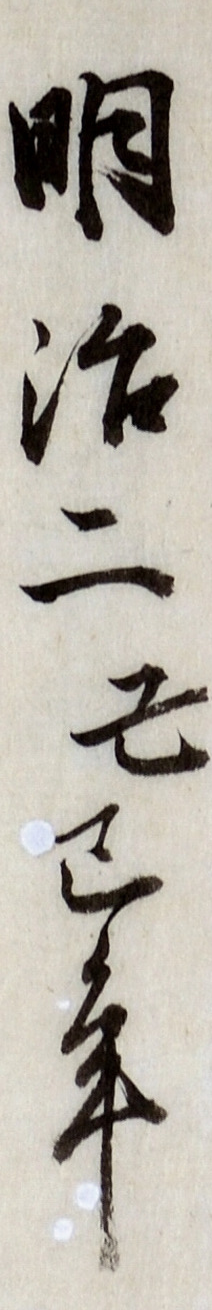明治二己巳年
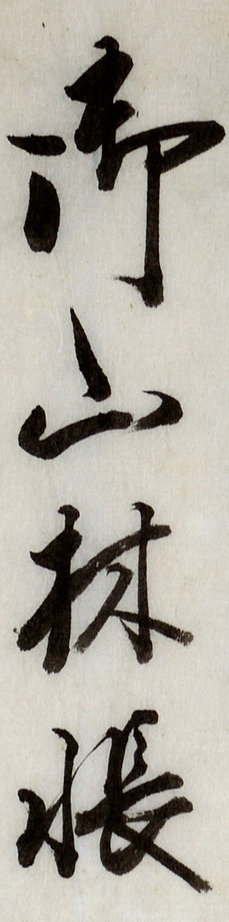御山林帳

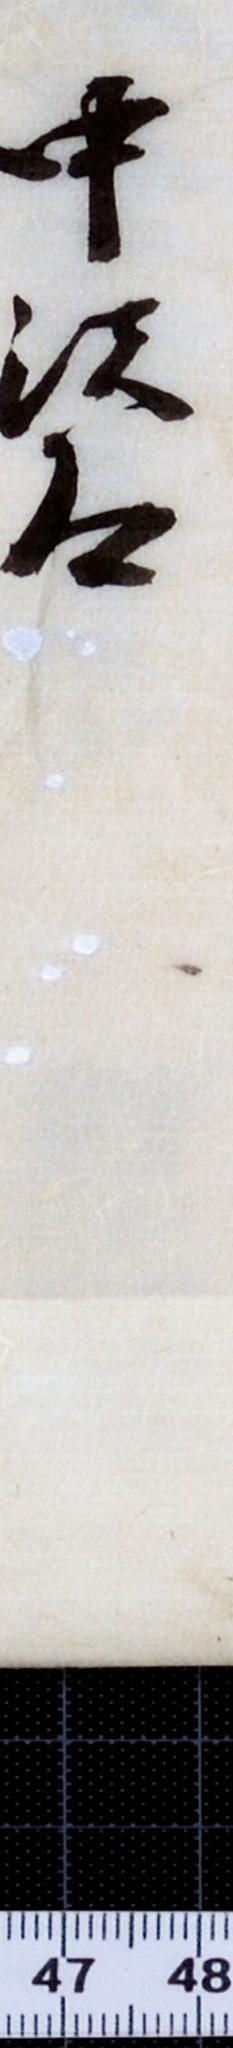中沢郷
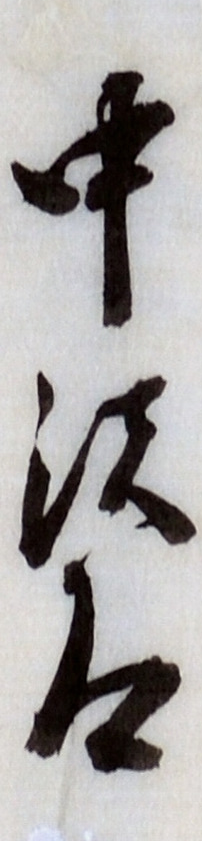中沢郷
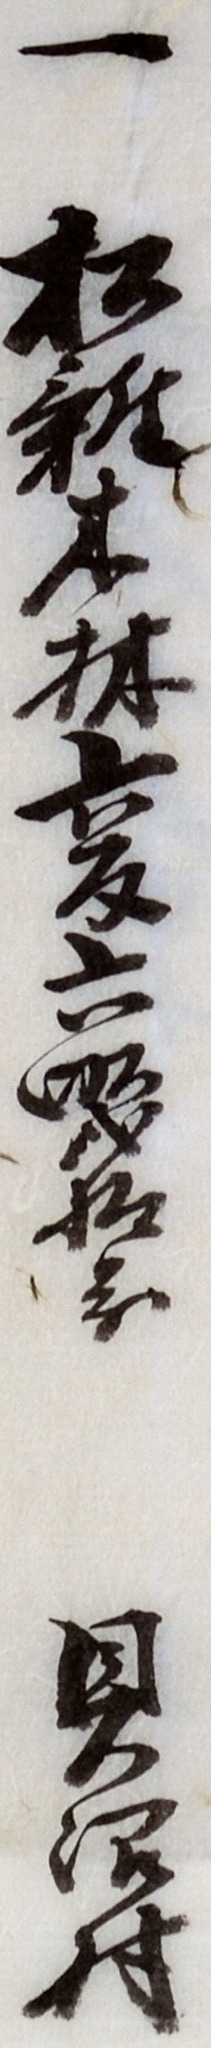一松雑木林六反六畝弐拾歩貝沼村
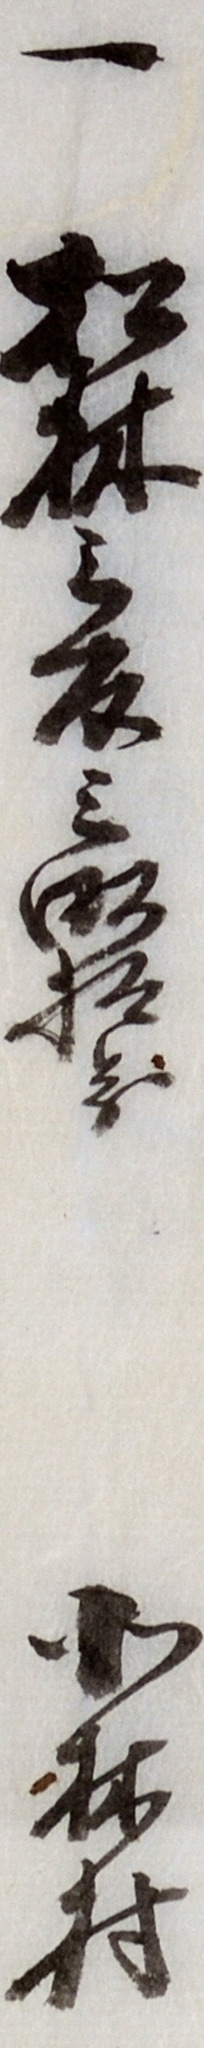一松林三反三畝拾歩北林村
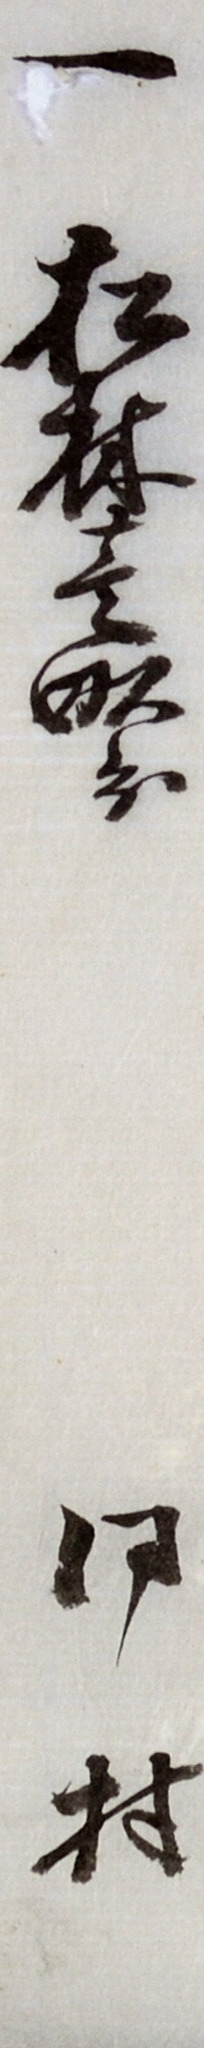一松林壱畝歩同村
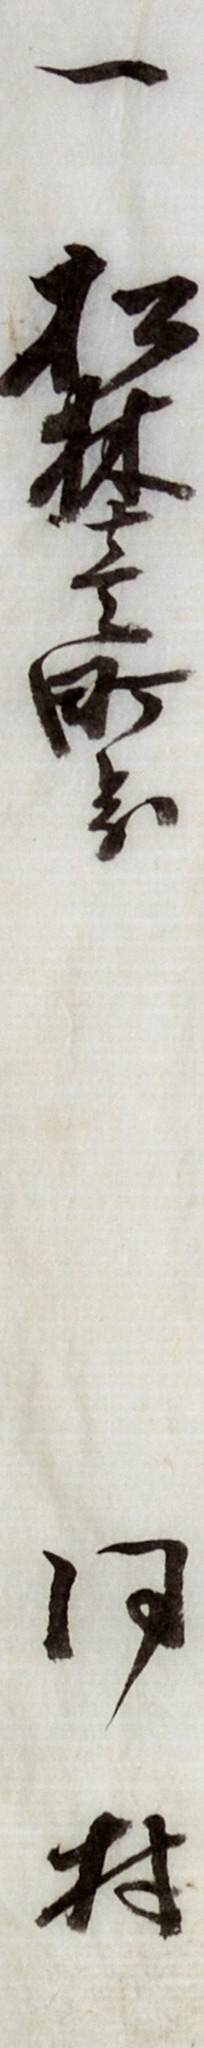一松林壱畝歩同村

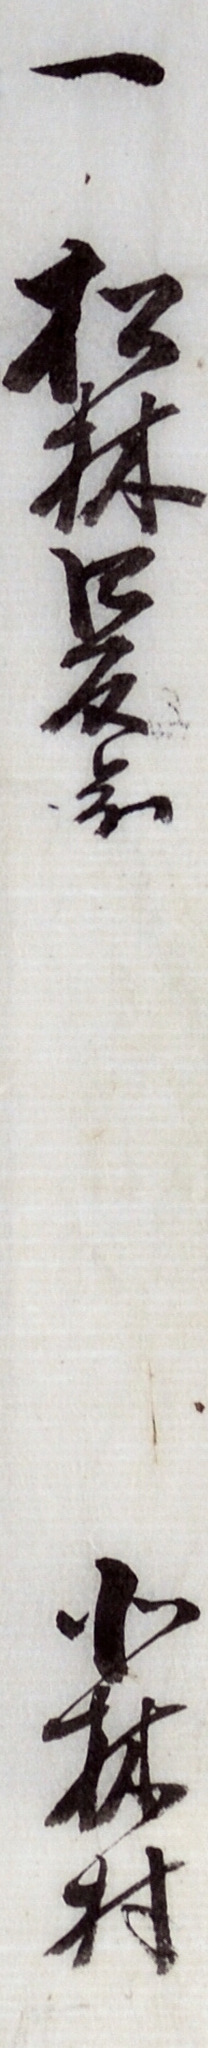一松林四反歩北林村
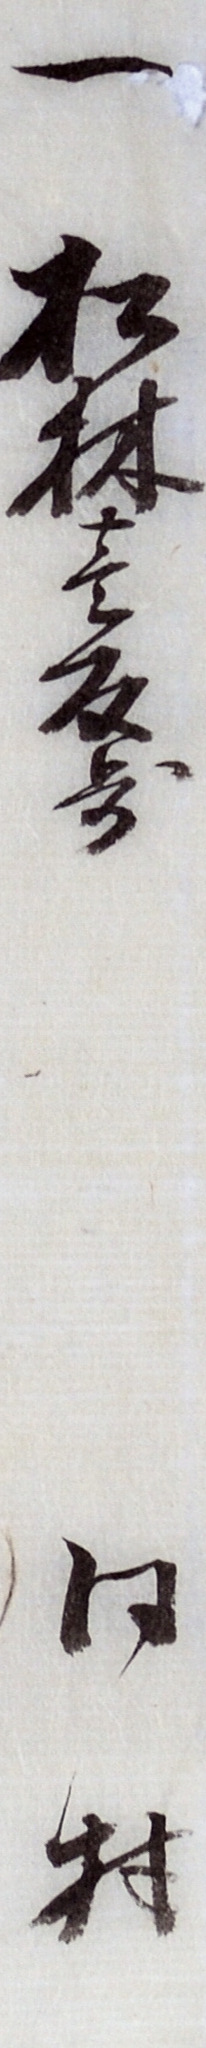一松林壱反歩同村
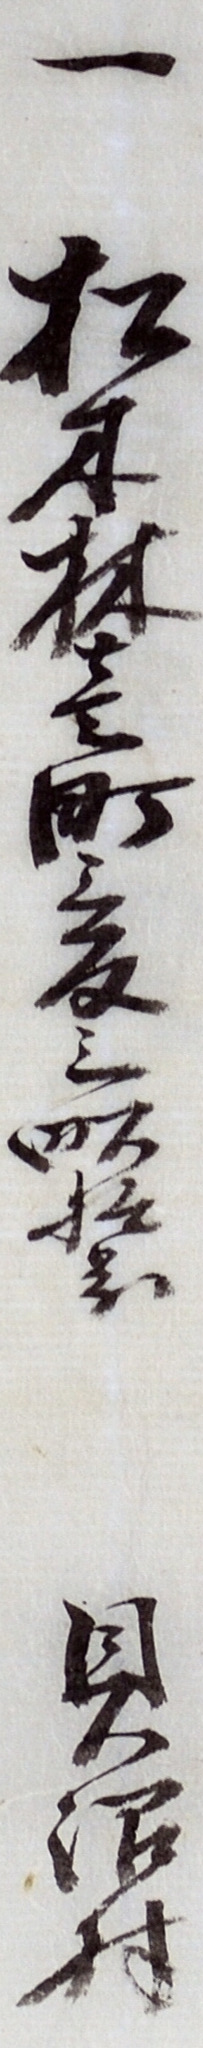一松木林壱町三反三畝拾歩貝沼村
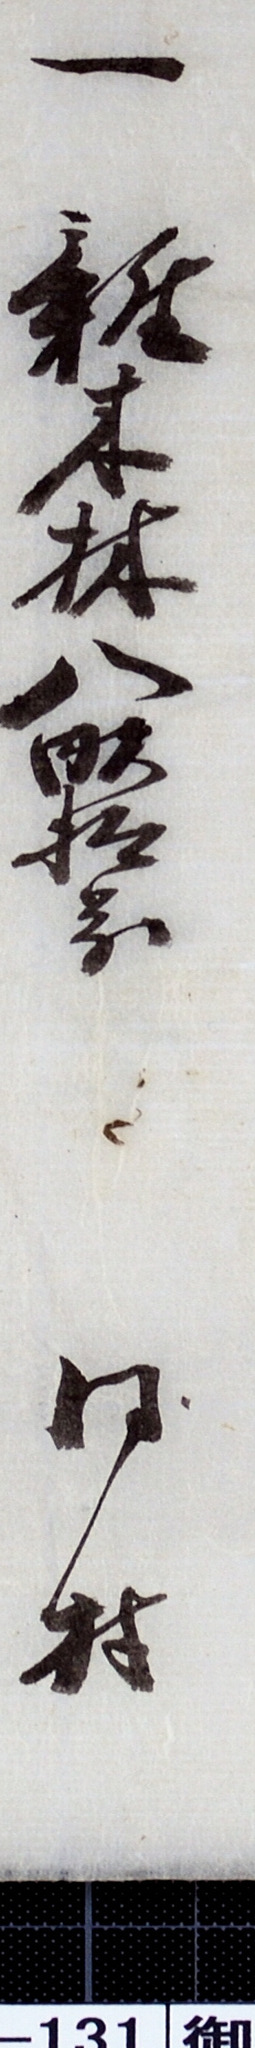一雑木林八畝拾歩同村
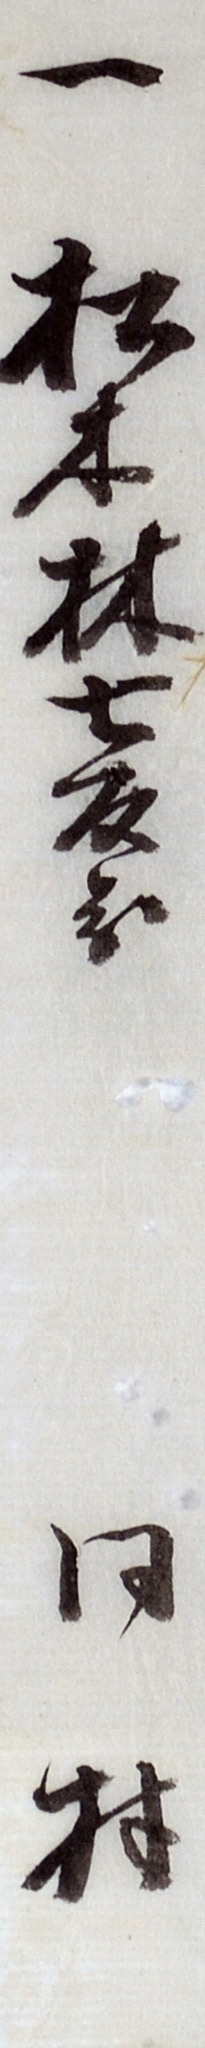一松木林七反歩同村
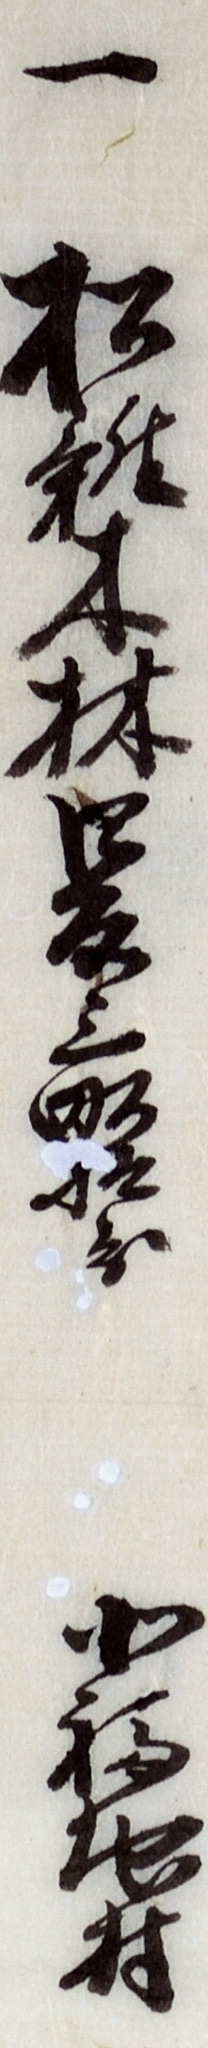一松雑木林四反三畝拾歩北副福地村
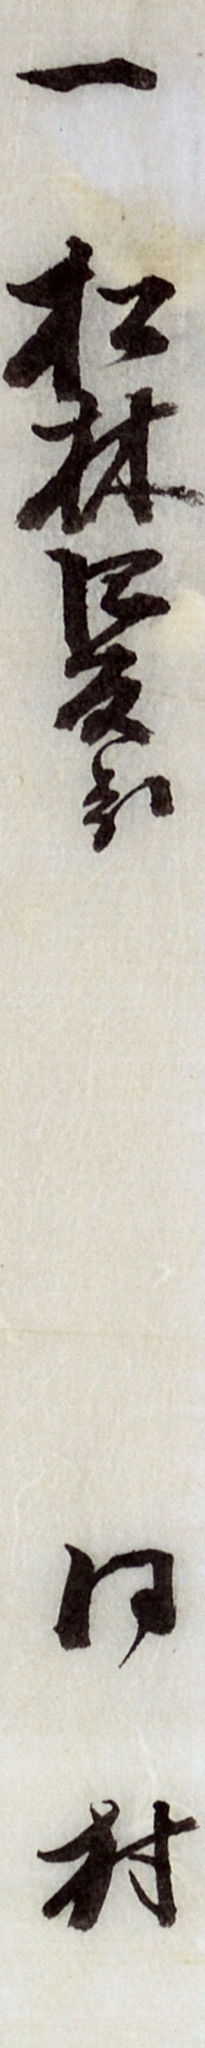一松林四反歩同村
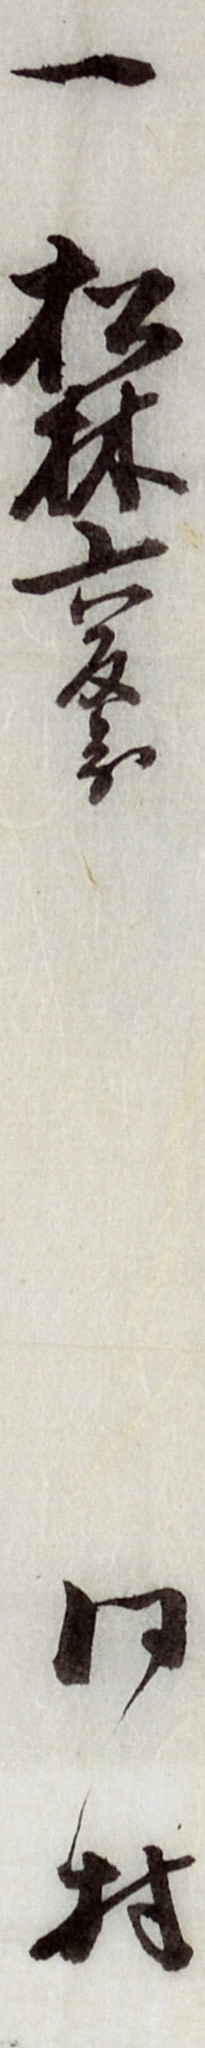一松林六反歩同村
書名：御山林帳
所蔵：伊那市立高遠町図書館・合同会社AMANE
